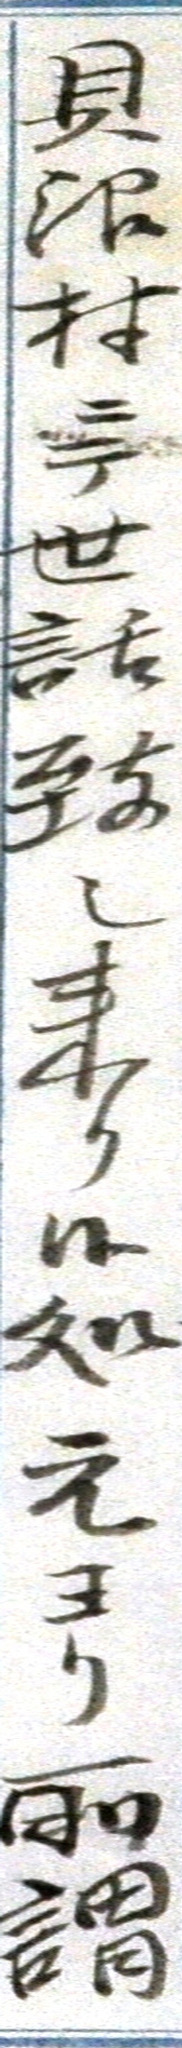貝沼村ニテ世話致シ来リ候処元ヨリ所謂
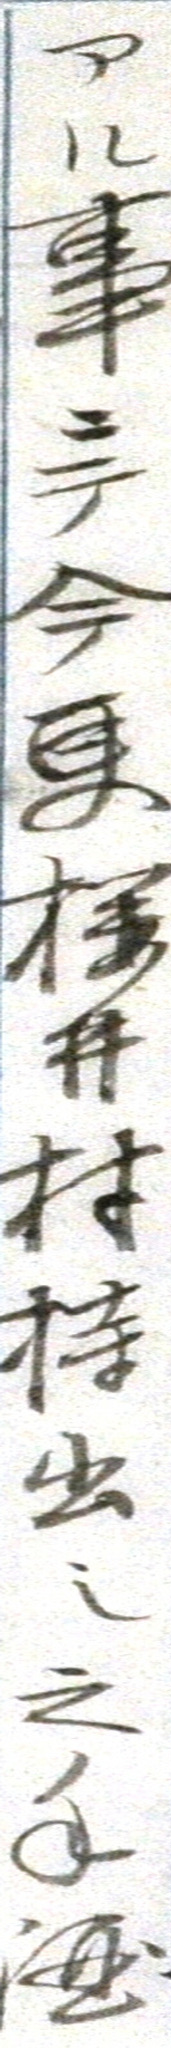アル事ニテ今更桜井村持出シ之手酒
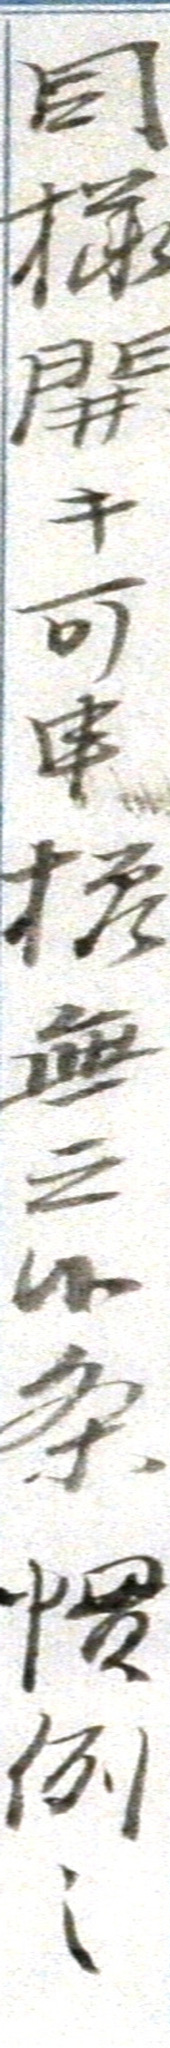同様開キ可申様無之候条慣例之
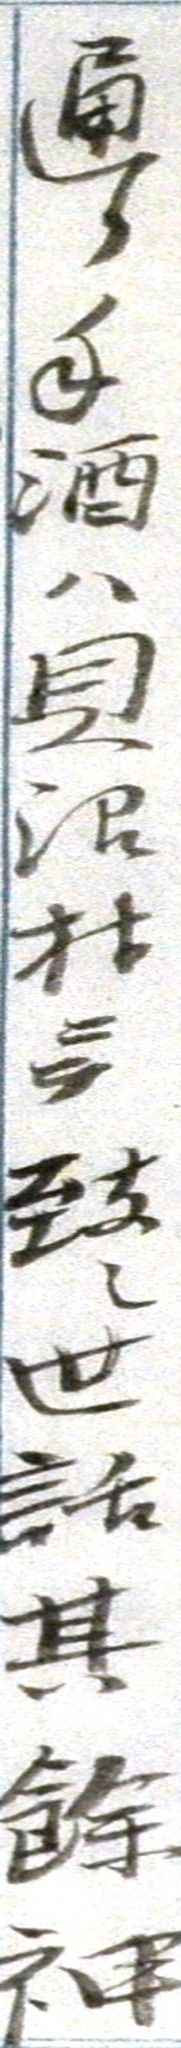通リ手酒ハ貝沼村ニテ致シ世話其余神
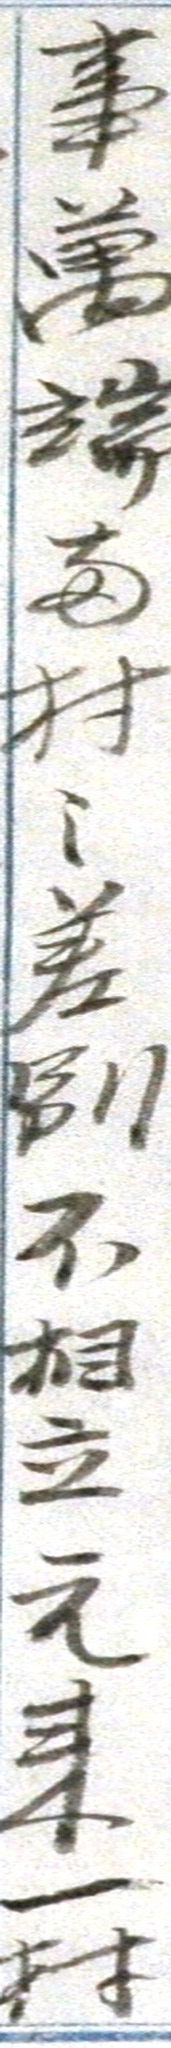事万端両村之差別不相立元来一村
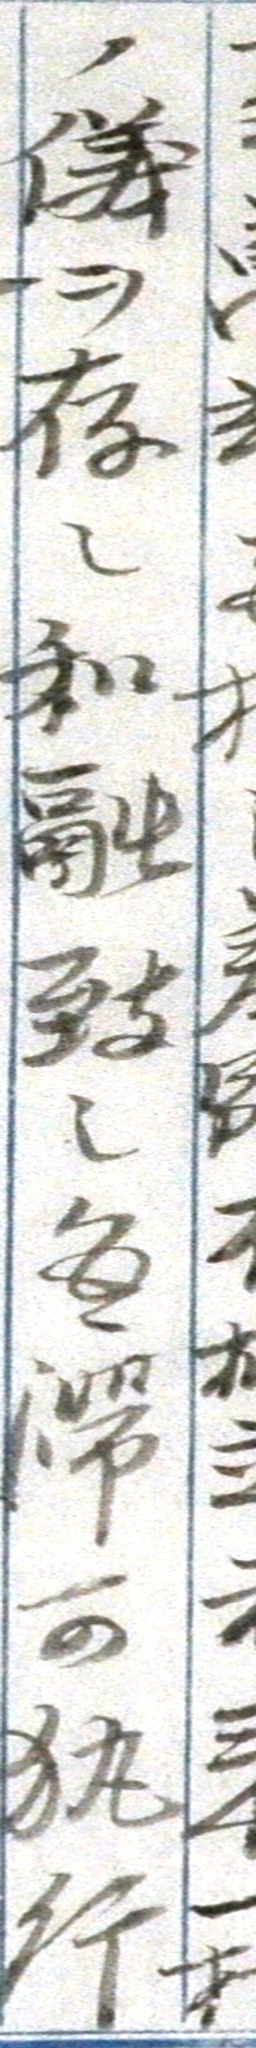ノ儀ヲ存シ和融致シ無滞可執行
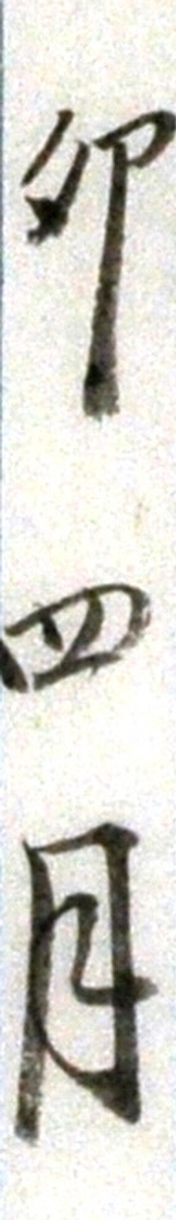卯四月
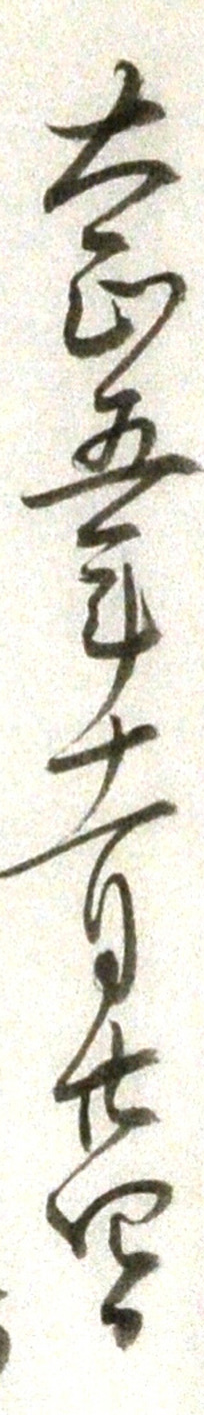大正五年十一月廿四日
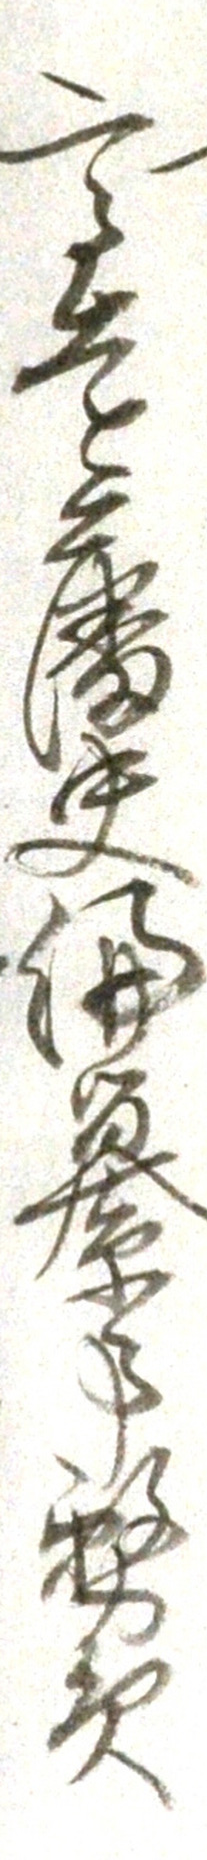高遠藩史編纂事務員
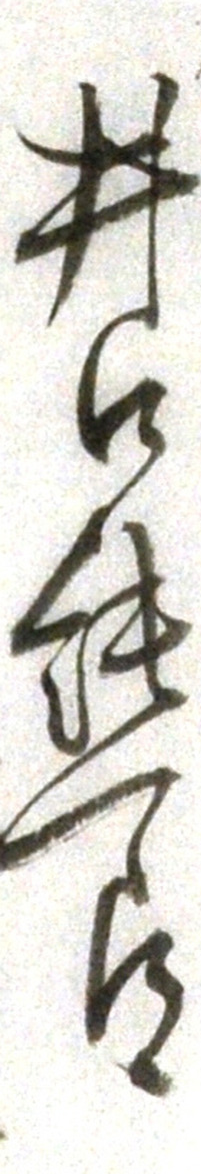井口純一郎
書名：貝沼村八幡社醴酒祭ニ関スル裁許状（写）
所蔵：伊那市立高遠町図書館・合同会社AMANE
